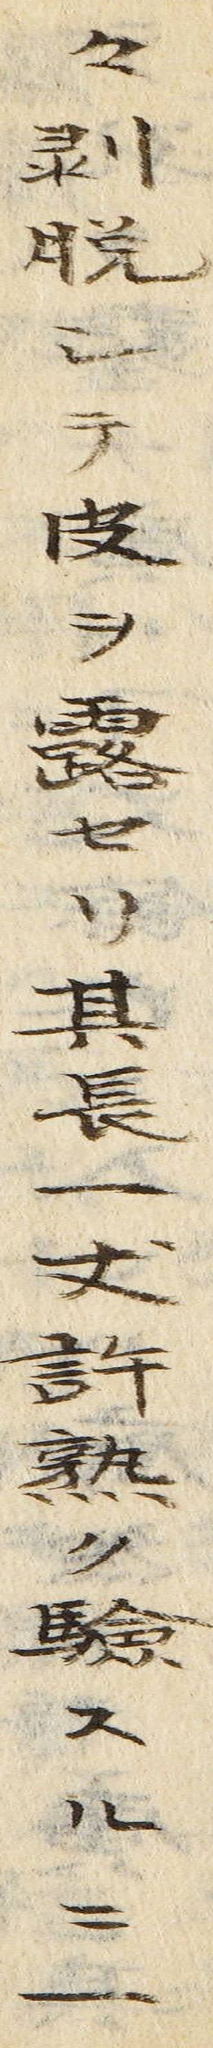々剥脱シテ皮ヲ露セリ其長一丈許熟ク験スルニ一
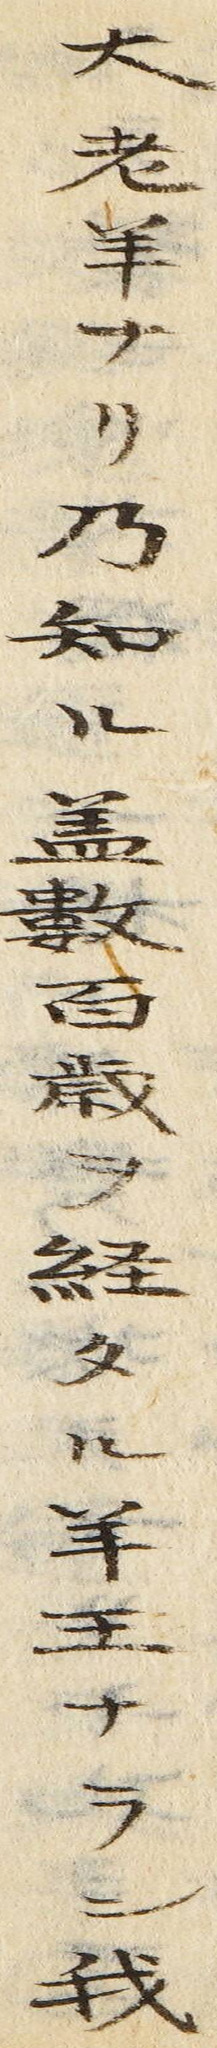大老羊ナリ乃知ル盖数百歳ヲ経タル羊王ナラン我
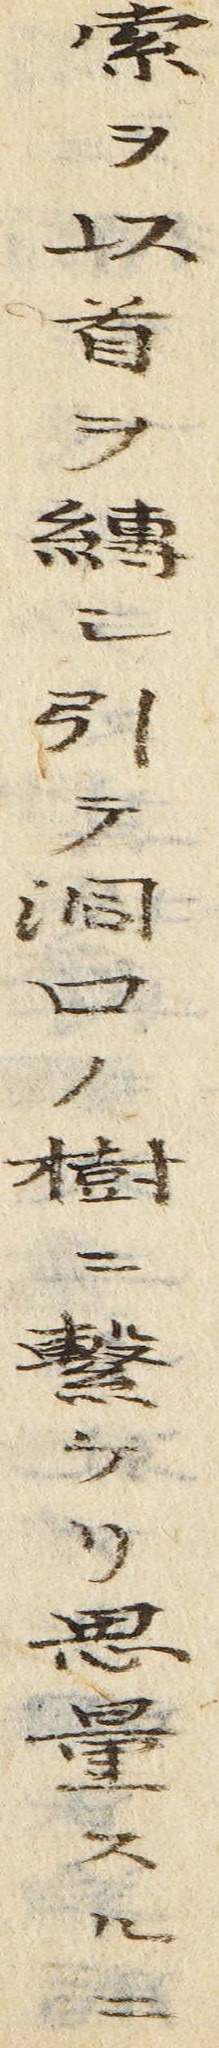索ヲ以首ヲ縛シ引テ洞口ノ樹ニ繋ケリ思量スルニ
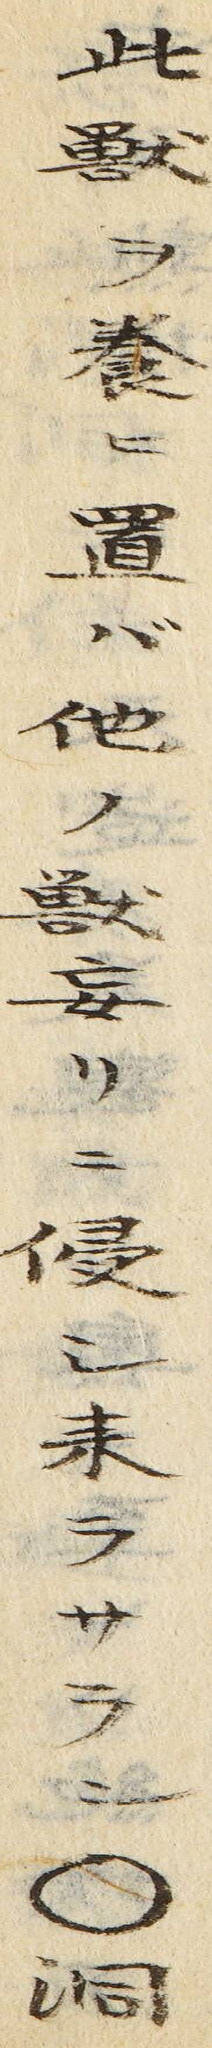此獣ヲ養ヒ置バ他ノ獣妄リニ侵シ来ラサラン◯洞

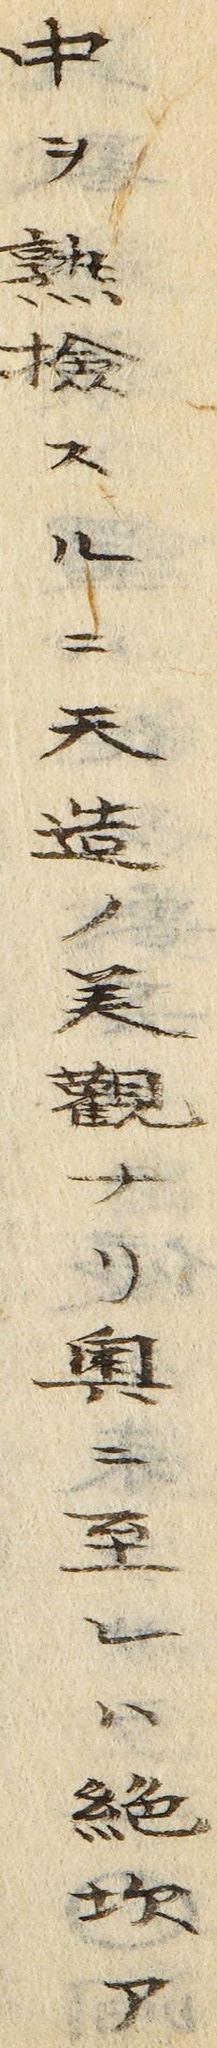中ヲ熟検スルニ天造ノ美観ナリ奥ニ至レハ絶坎ア
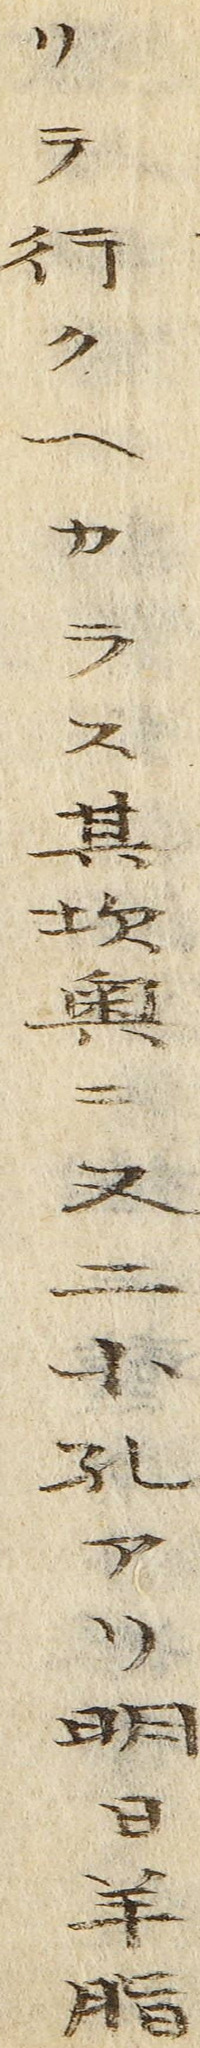リテ行クヘカラス其坎奥ニ又二小孔アリ明日羊脂
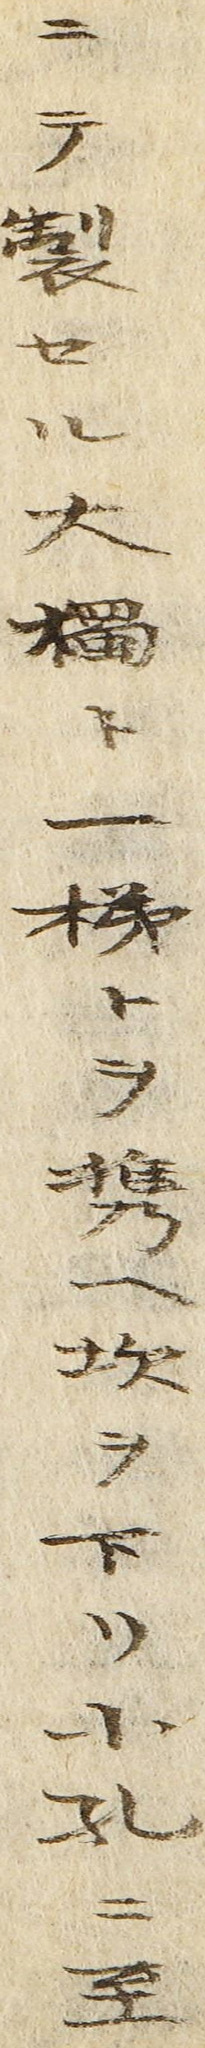ニテ製セル大燭ト一梯トヲ携ヘ坎ヲ下リ小孔ニ至
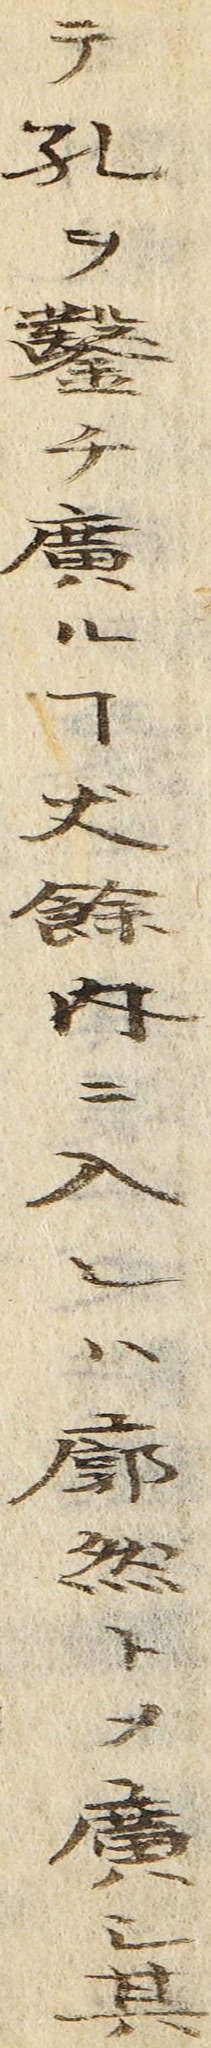テ孔ヲ鑿チ広ルコト丈余内ニ入レハ廓然トシテ広シ其
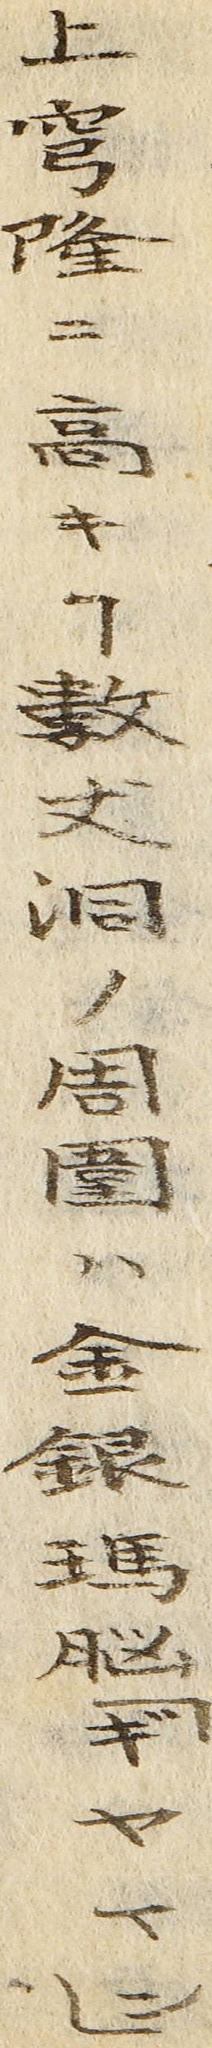上穹隆ニ高キコト数丈洞ノ周囲は金銀瑪脳「ギヤマン」
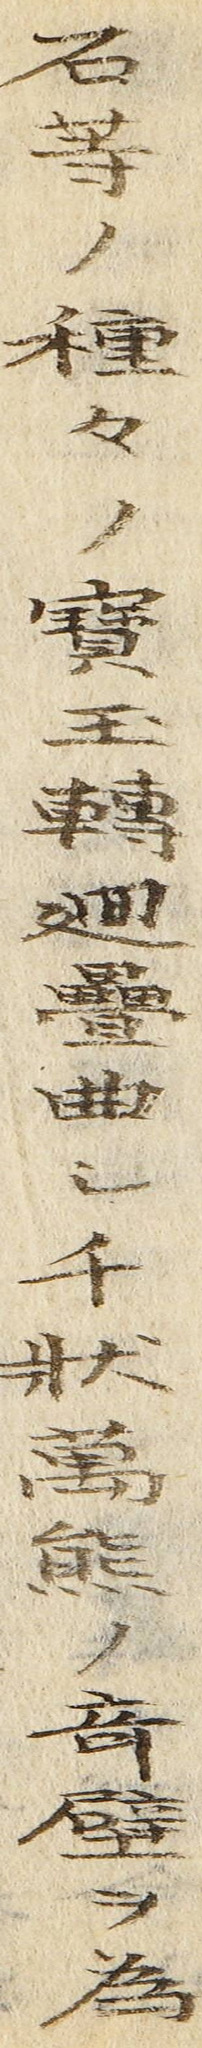石等ノ種々ノ宝玉転廻畳曲シ千状萬熊ノ奇壁ヲ為
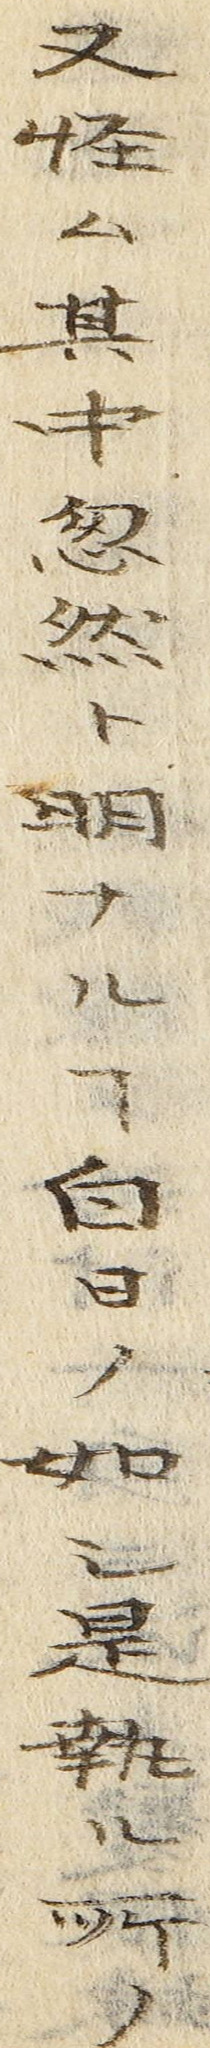又怪ム其中忽然ト明ナルコト白日ノ如シ是執ル所ノ
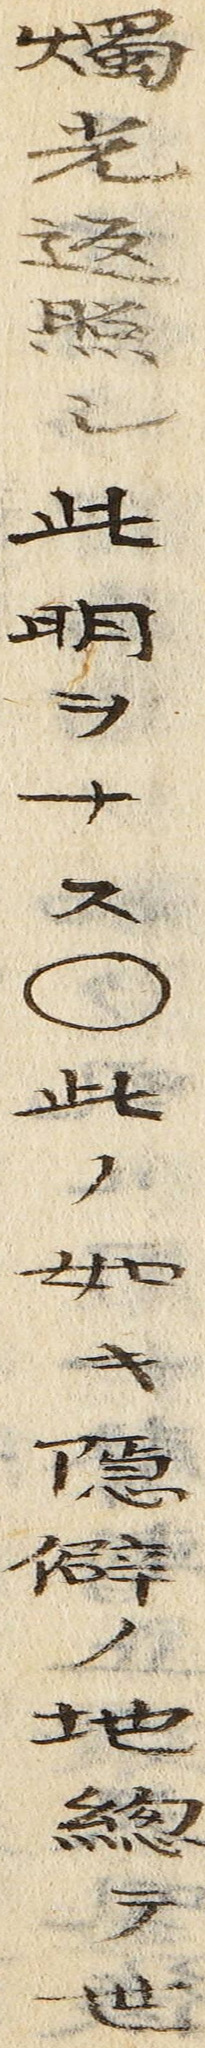燭光返照シ此明ヲナス◯此ノ如キ隠僻ノ地総テ世
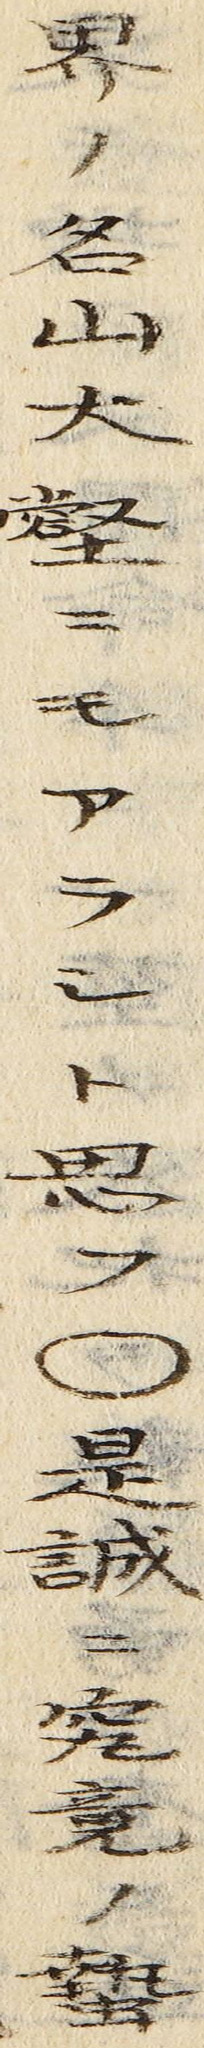界ノ名山大壑ニモアラシト思フ◯是誠ニ究竟ノ蟄
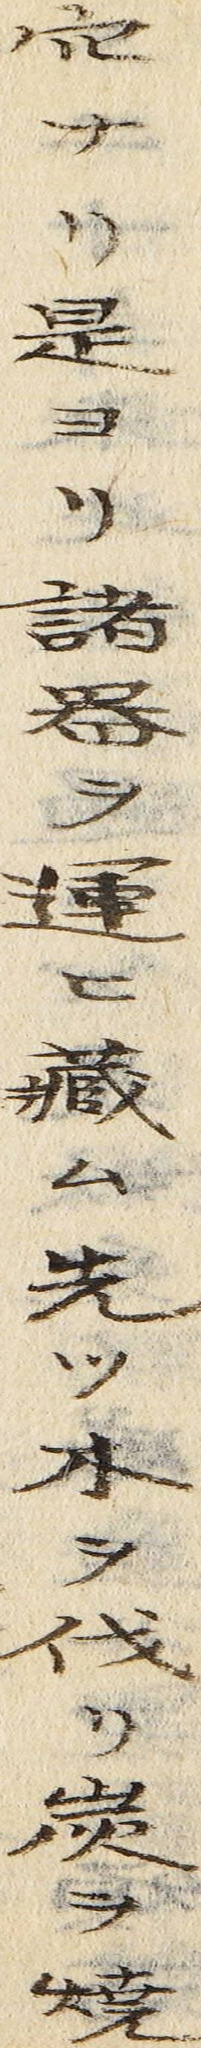穴ナリ是ヨリ諸器ヲ運ヒ蔵ム先ツ木ヲ伐リ炭ヲ焼
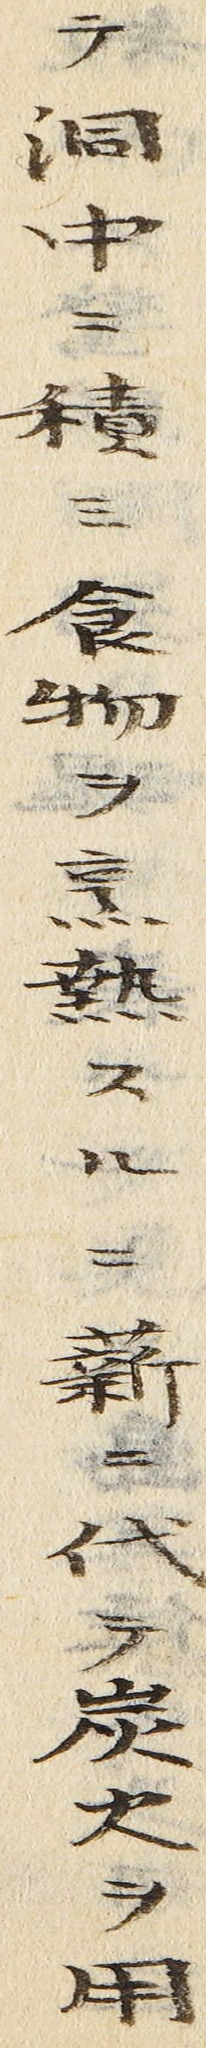テ洞中ニ積ミ食物ヲ烹熱スルニ薪ニ代テ炭火ヲ用
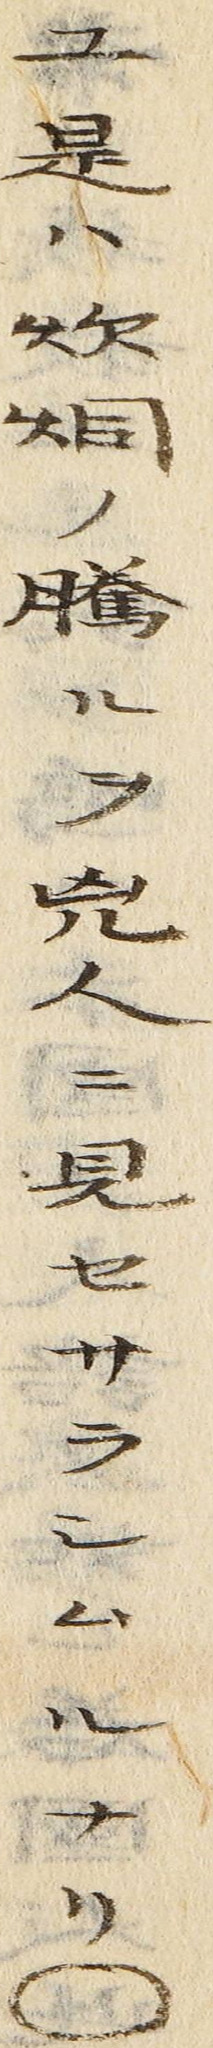ユ是ハ炊煙ノ騰ルヲ兇人ニ見セサラシムルナリ◯
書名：漂流紀事
